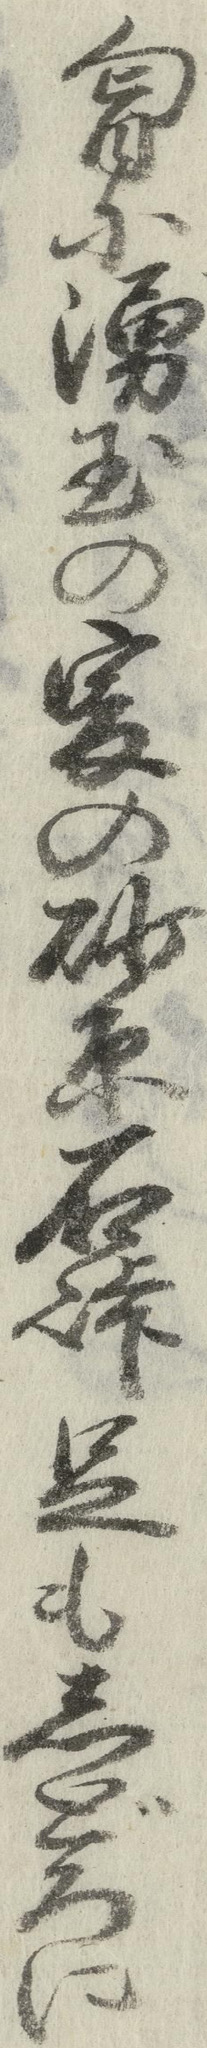胸に湧玉の爰の砂原石峠足もしどろに
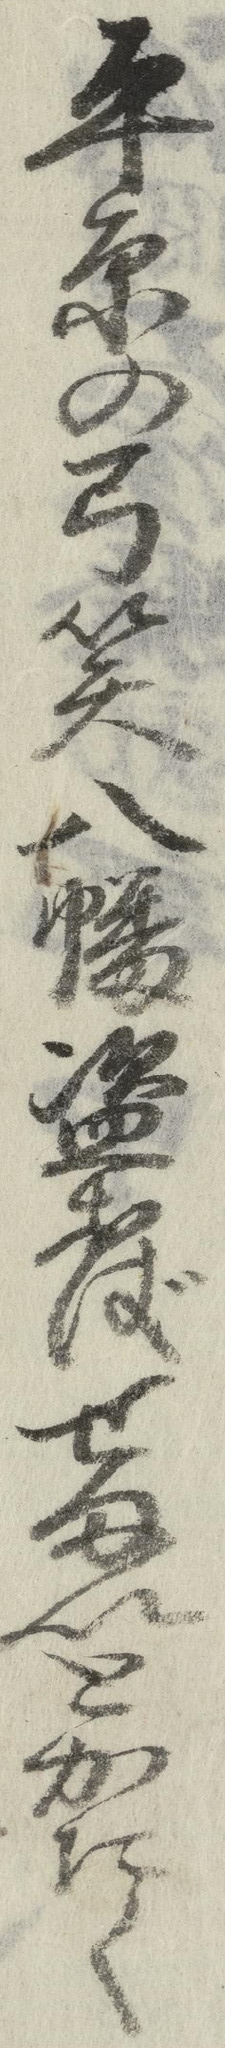平原の弓笑八幡盗おばせまいとかたく
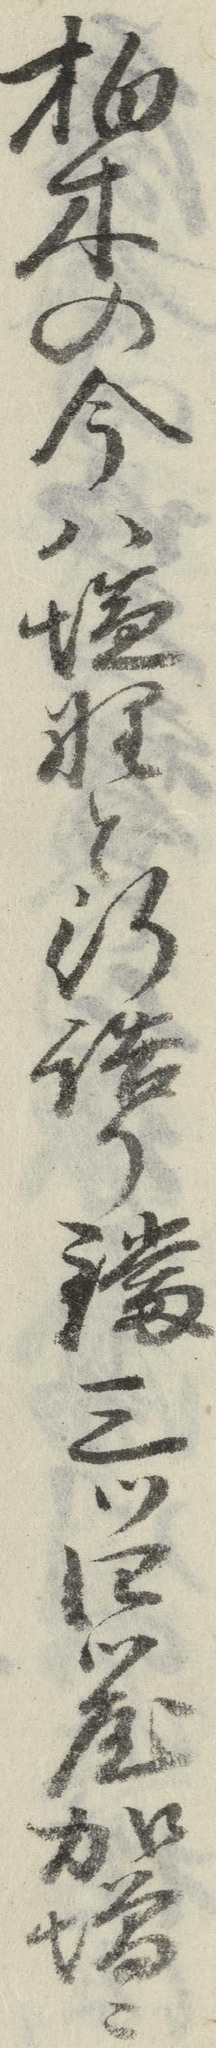柏木の今は塩野と行詰り鐺三ツ四ツ屋加増に
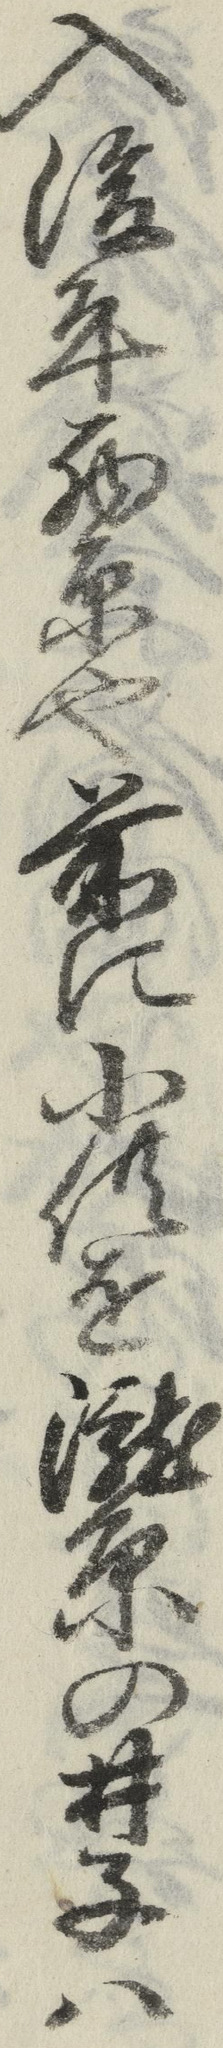入後平西原や前に小供を瀧原の井子は
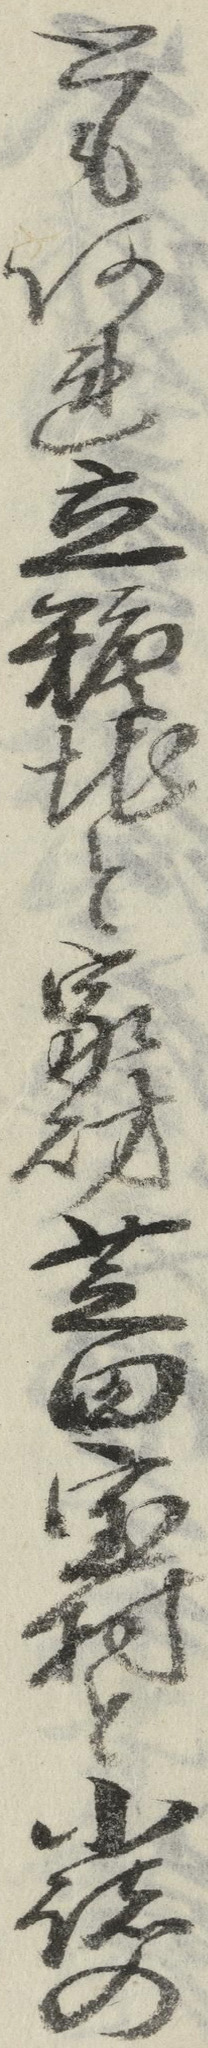ともあれ立糖地と家財芝田宝村と小諸の
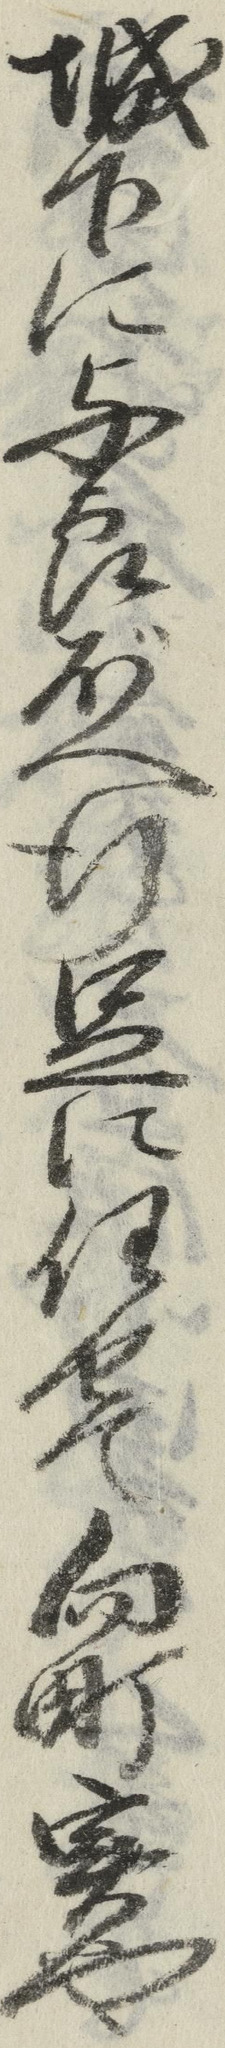城下によろぼへ行足に任せて向町実や
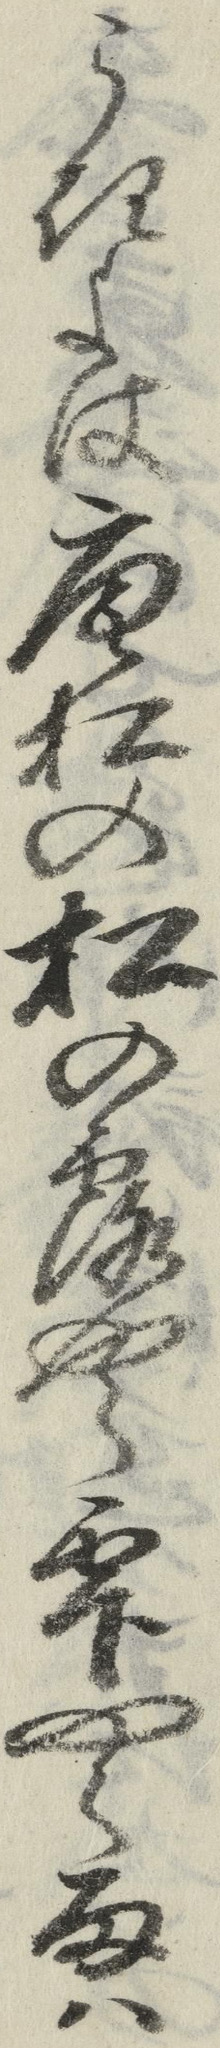うきよは唐松の松の露やら雫やら雨は
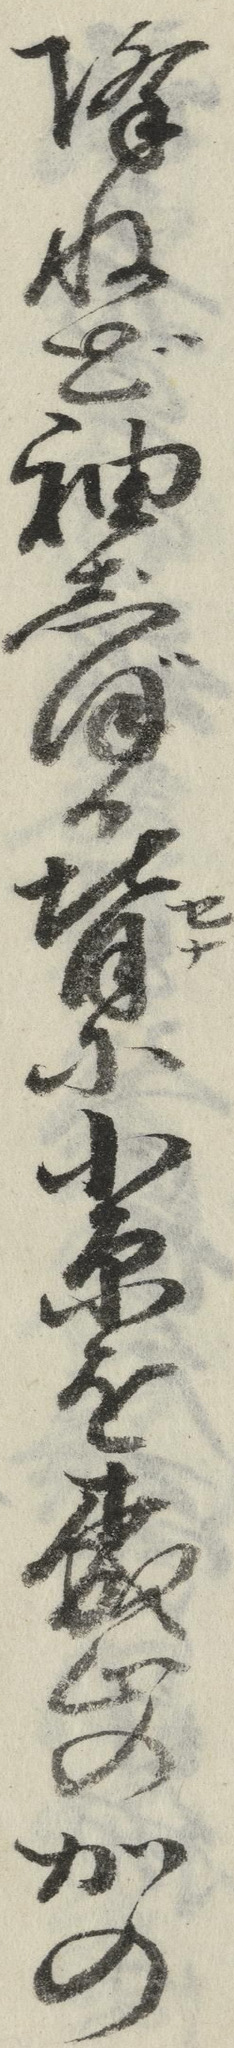降ねど袖しぼる背に小原を森山のかの
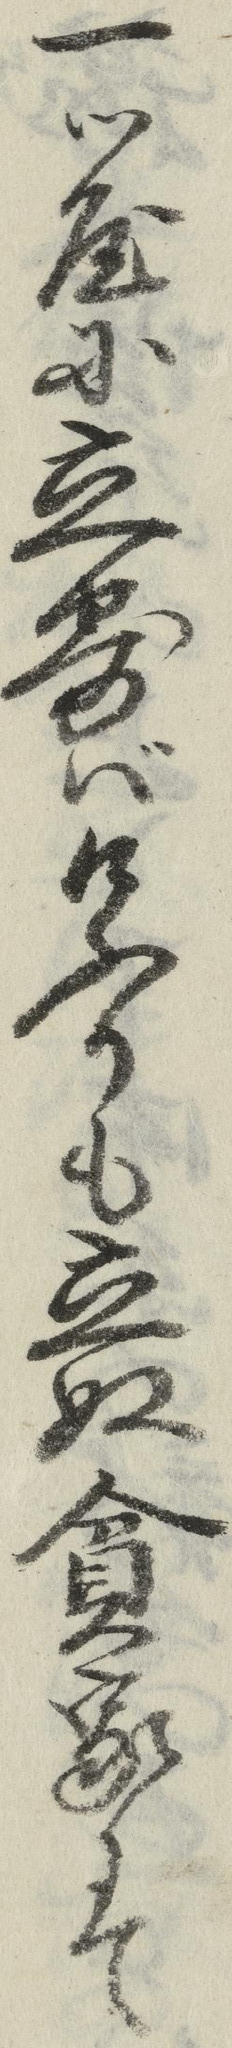一ツ屋に立寄ばけふりも立ぬ貧家にて
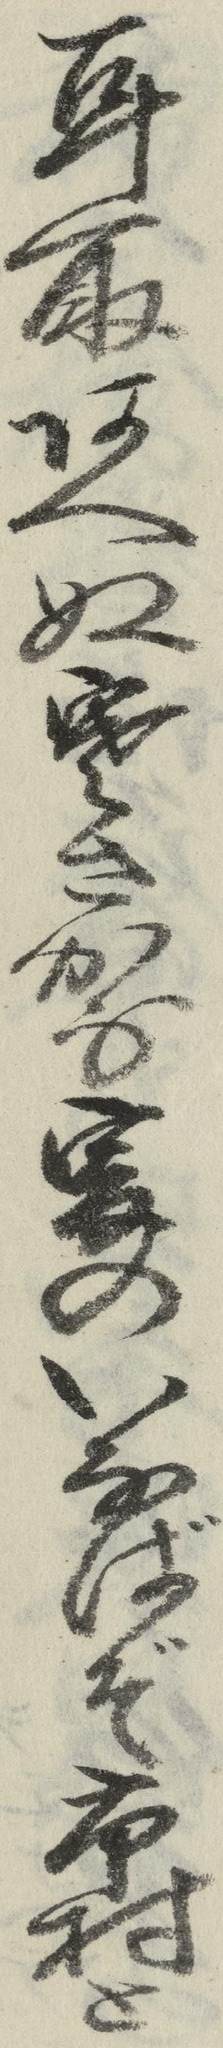耳取あへぬ寒さかな爰のいなばぞ市村と

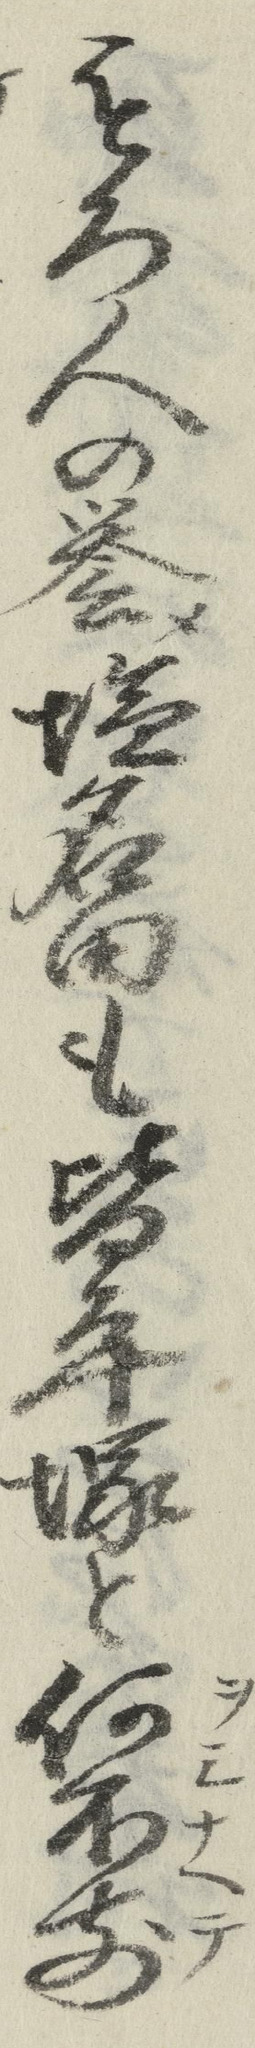もろ人の誉塩名田も皆平塚と何不前
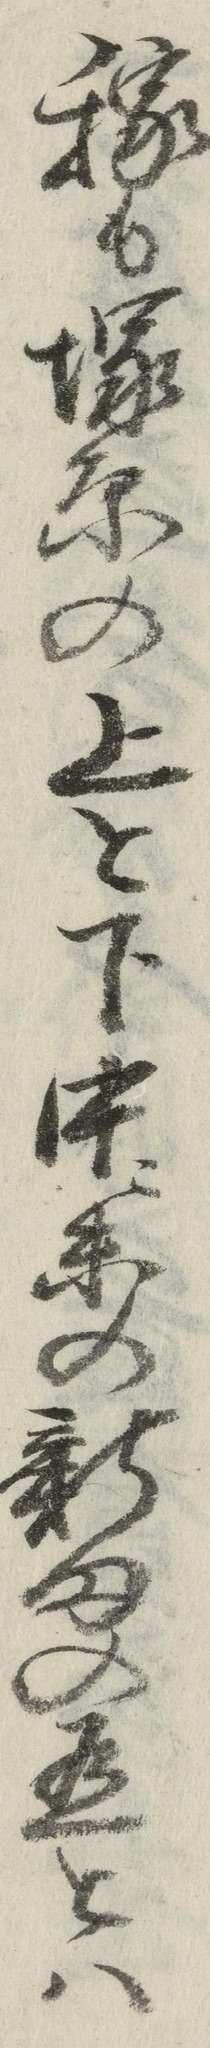稼も塚原の上と下中に末の新田の有とは
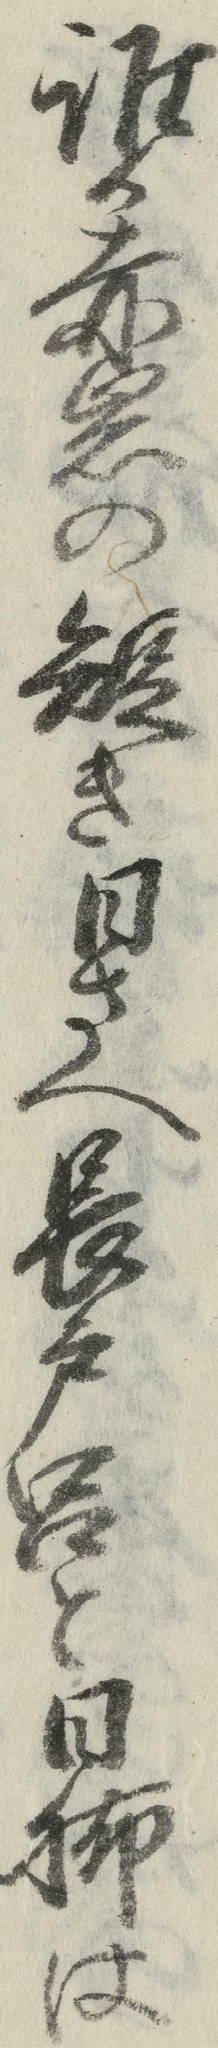誰か赤岩の短き日さへ長戸呂と日怖は
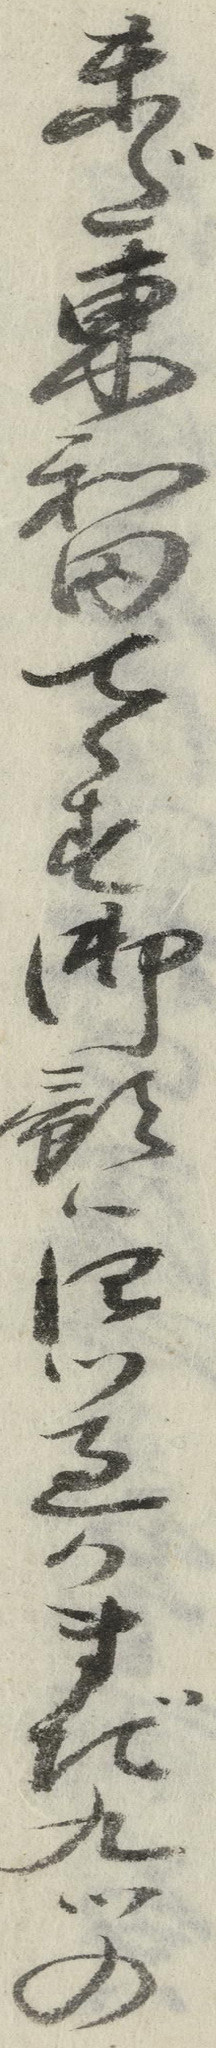未だ東和田てらす御影は四ツ過かまだ九ツの
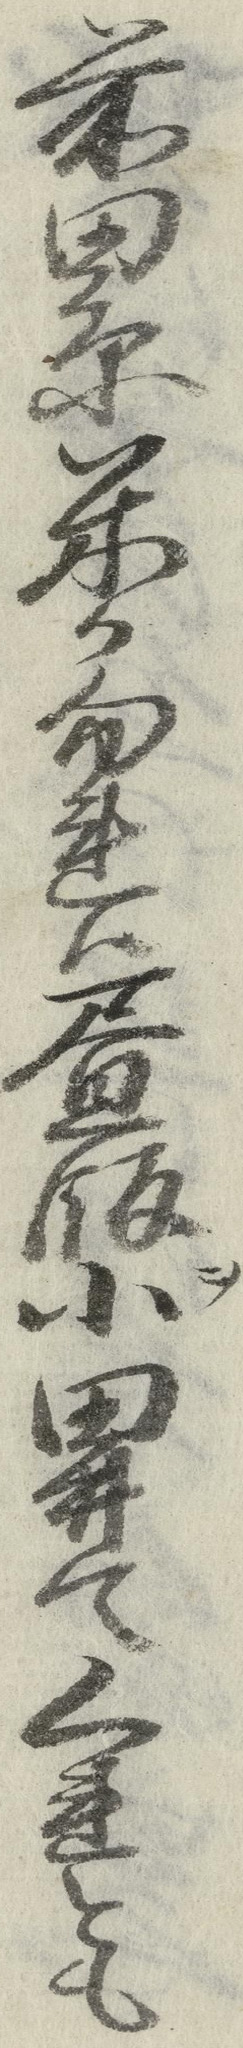前田原米か勿れハ昼飯小田井てくれとも
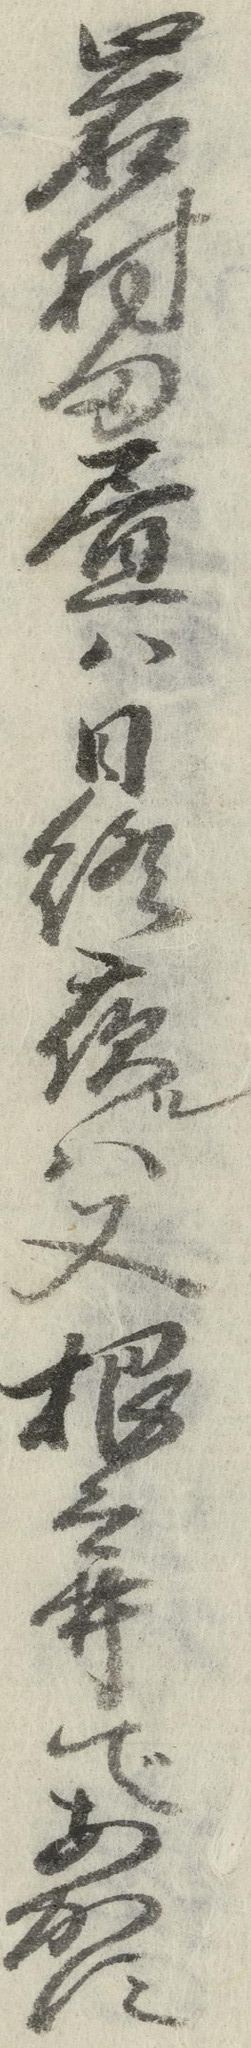岩村た昼ハ日終夜又根ないであかす
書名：浅間大焼騒動記　中
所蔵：東京大学地震研究所図書室 Earthquake Research Institute Library, The University of Tokyo, JAPAN
